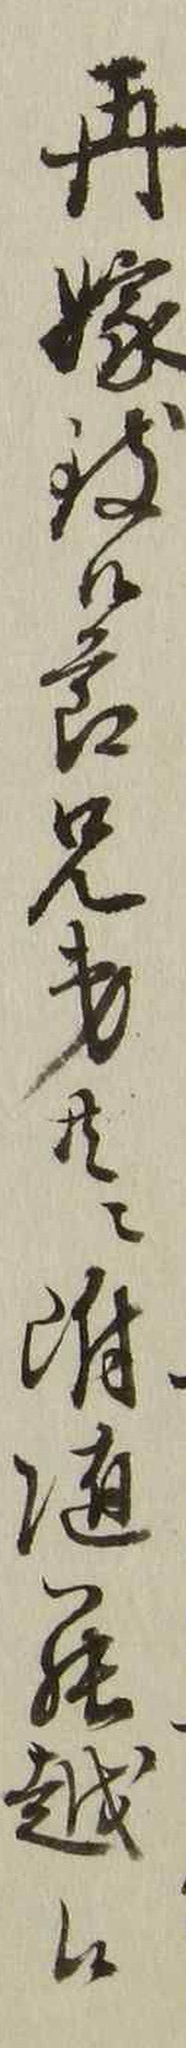再嫁致候節兄弟共ニ附随罷越候
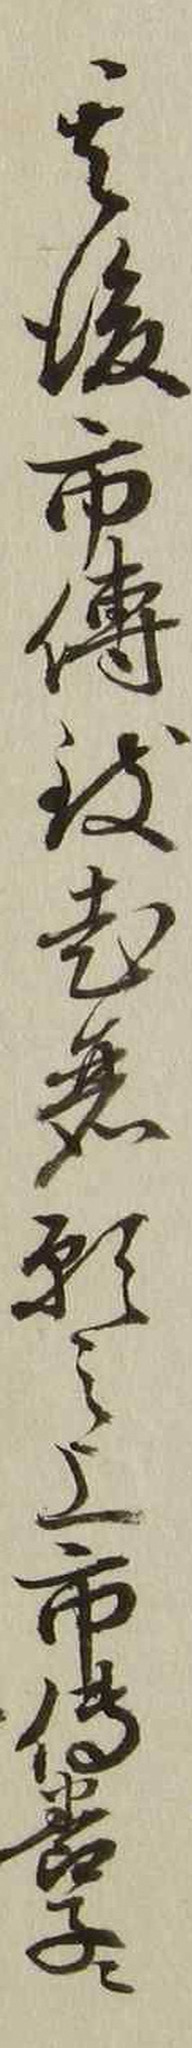其後市伝致老衰願之上市伝養子ニ
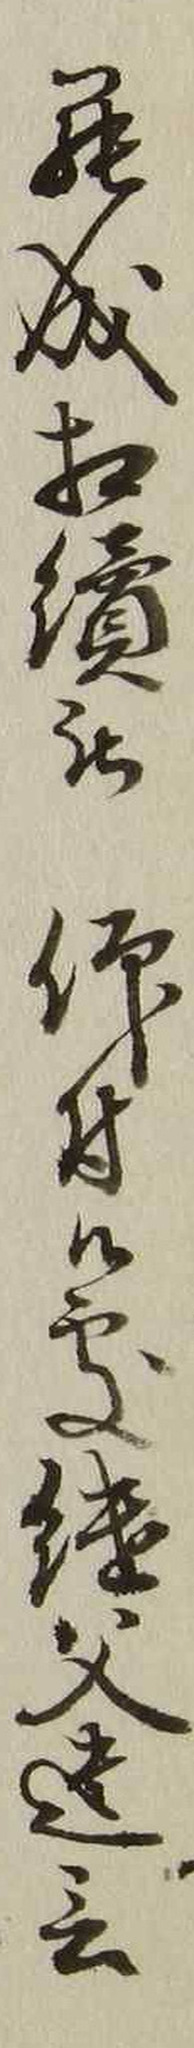罷成相続被仰付候処継父遺言
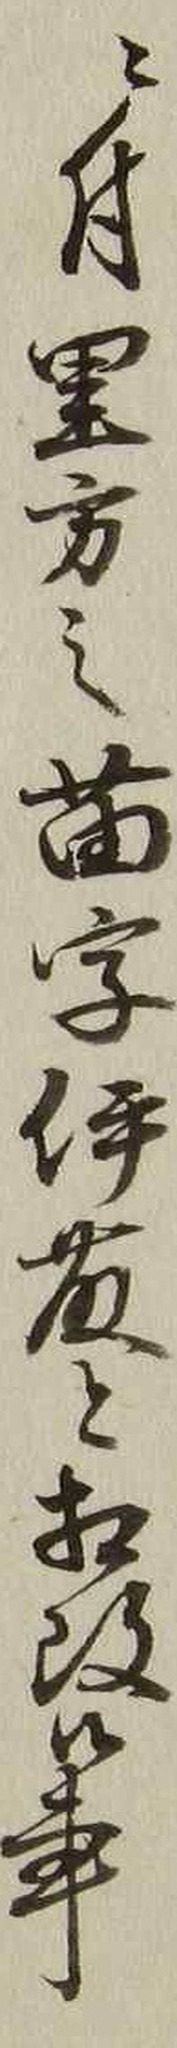ニ付里方之苗字伊藤と相改候事
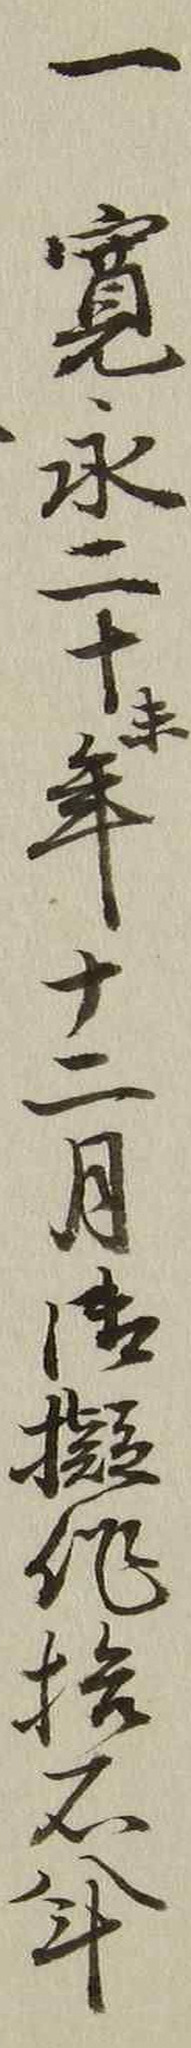一寛永二十未年十二月御擬作拾石八斗
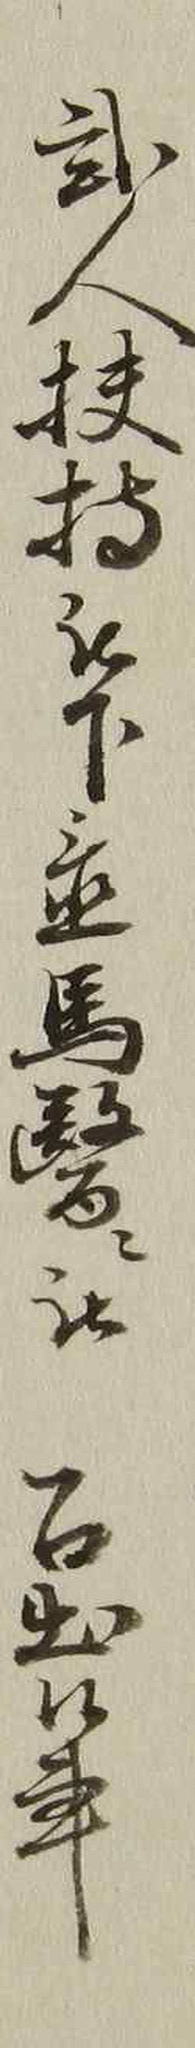弐人扶持被下置馬医ニ被召出候事
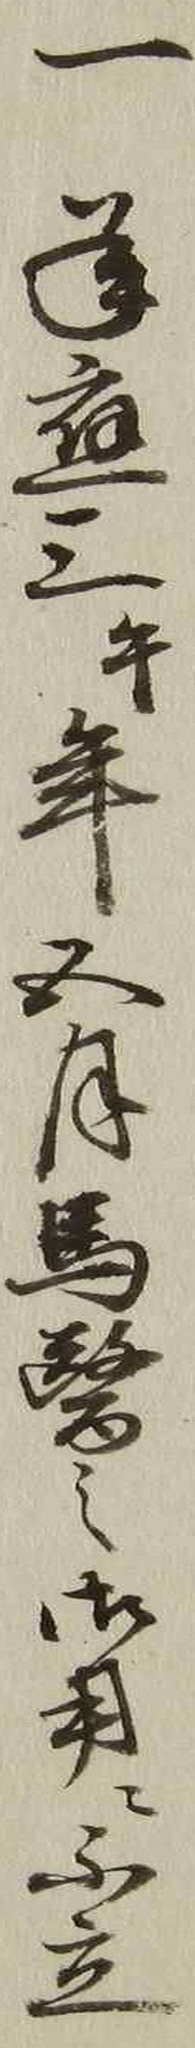一承応三午年五月馬医之御用ニ不立
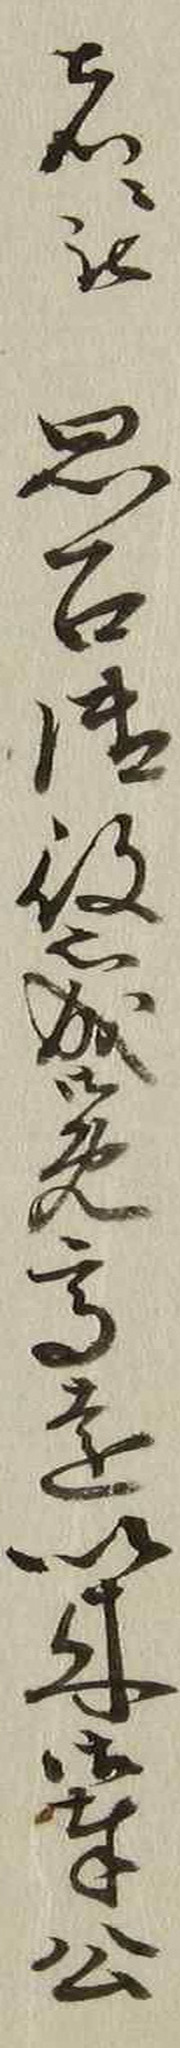者ニ被思召御役被成御免高遠以来御奉公
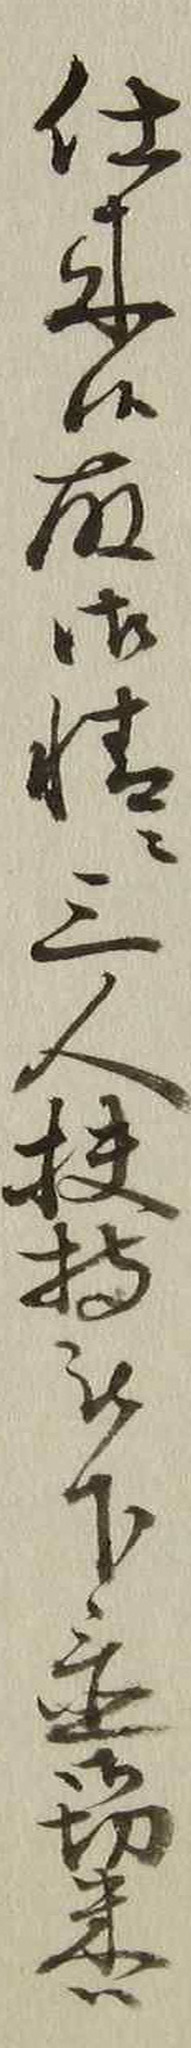仕来候故御情ニ三人扶持被下置御切米ハ
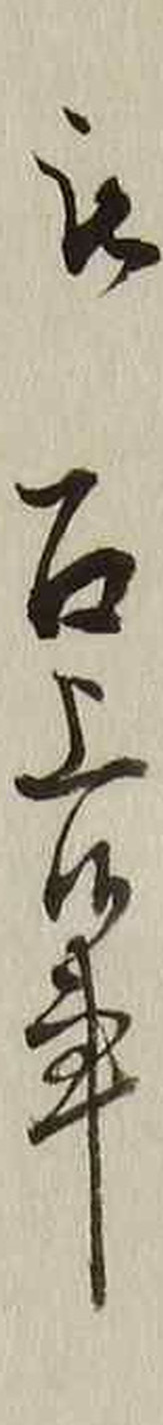被召上候事
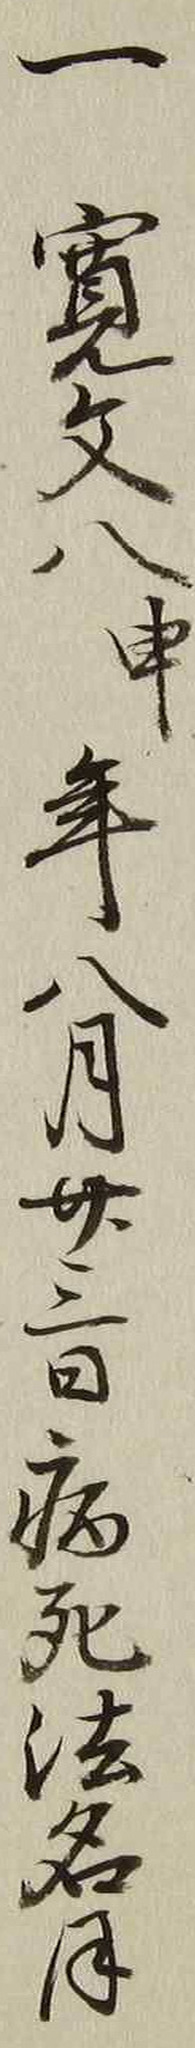一寛文八申年八月廿三日病死法名月
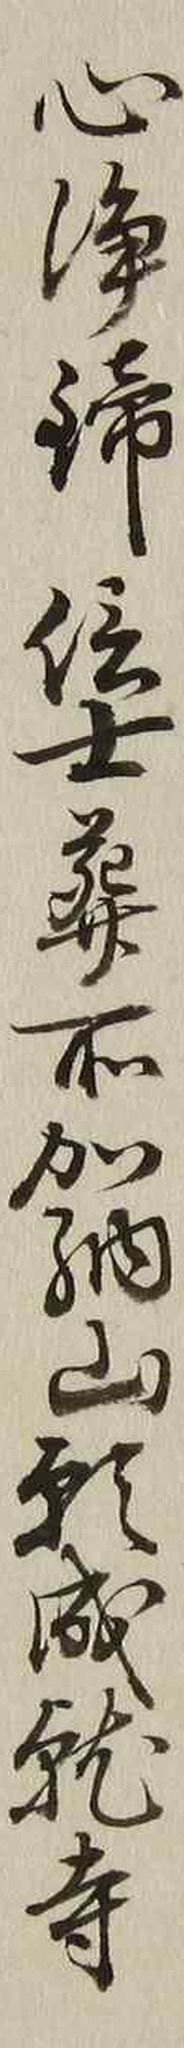心浄鍗信士葬所加納山願成就寺
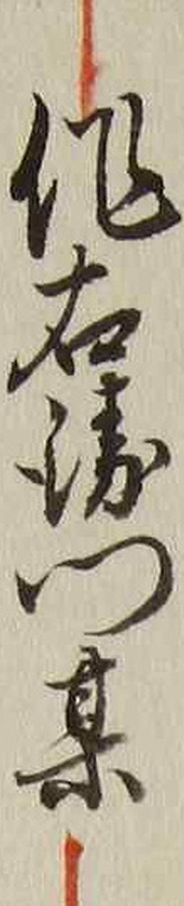作右衛門某
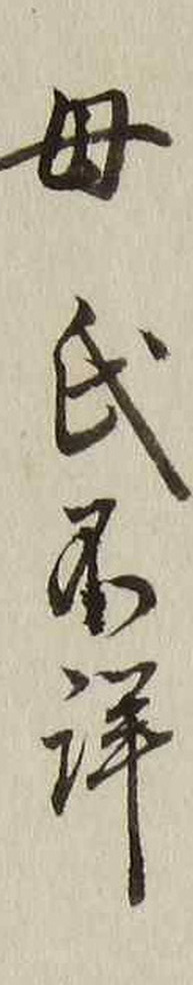母氏不詳
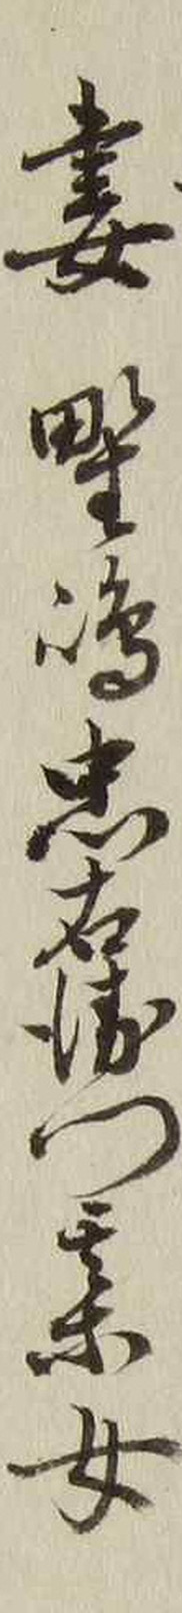妻野嶋忠右衛門某女
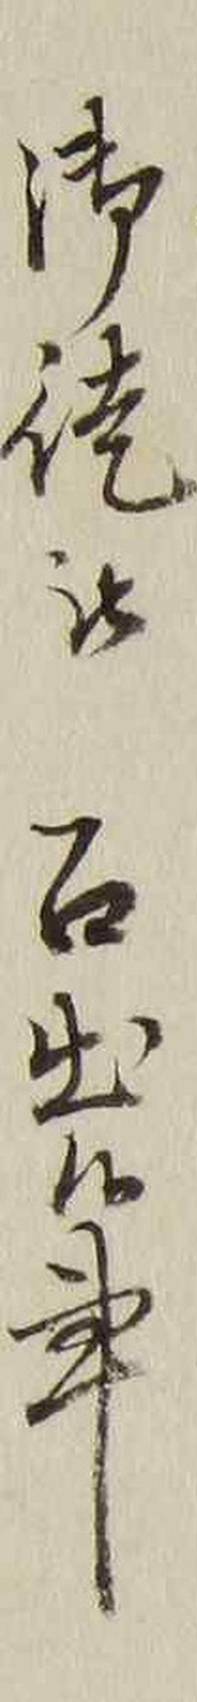御徒被召出候事
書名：諸士系譜　巻之27　い之部27
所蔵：会津若松市立会津図書館
